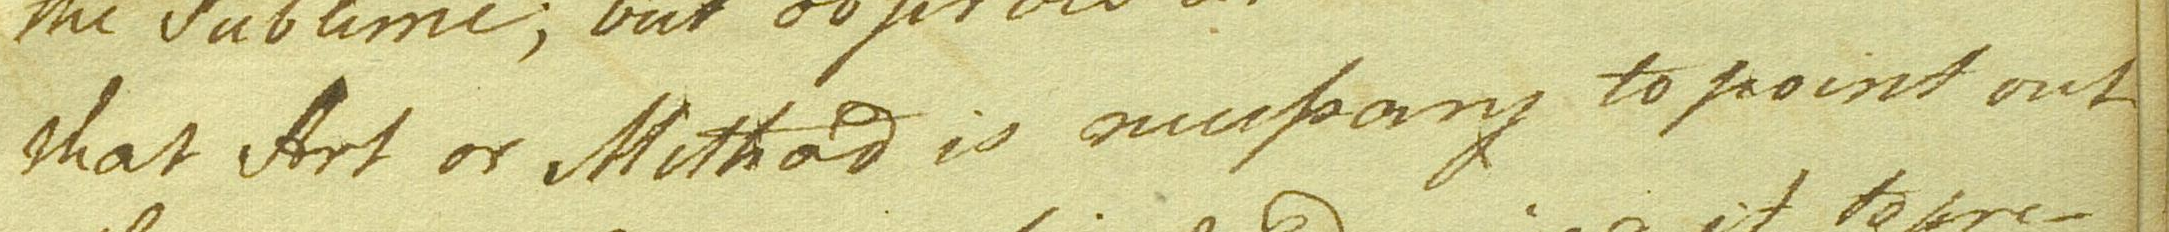that Art or Method is necessary to point out
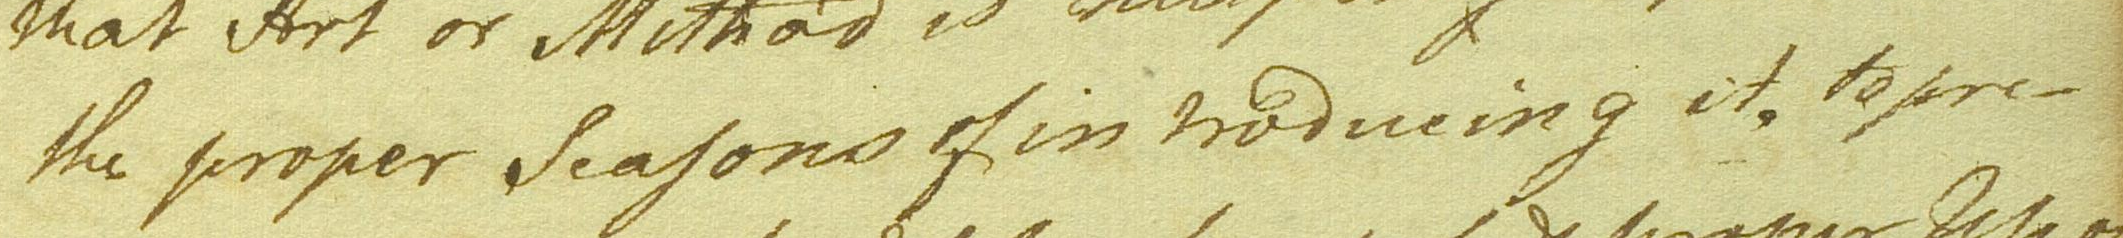the proper Seasons of introducing it, to pre-
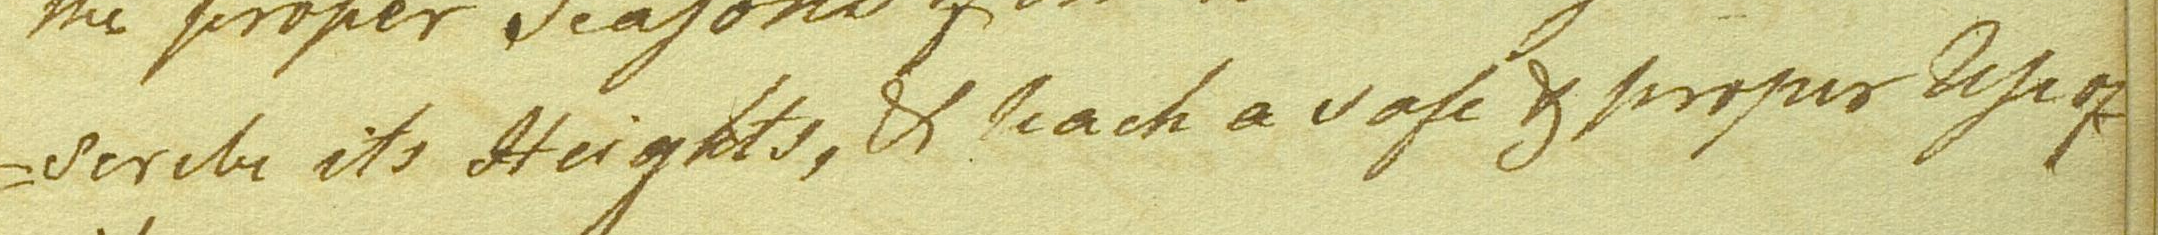-scribe its Heights, & teach a safe & proper Use of
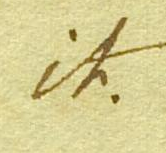it.
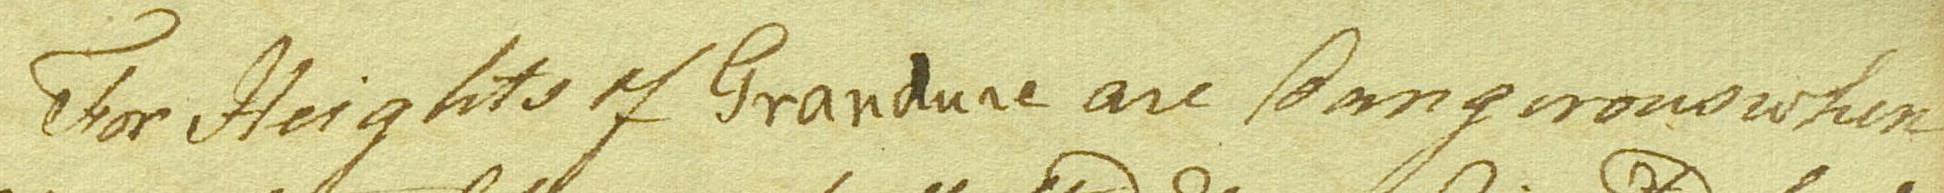For Heights of Grandure are dangerous when
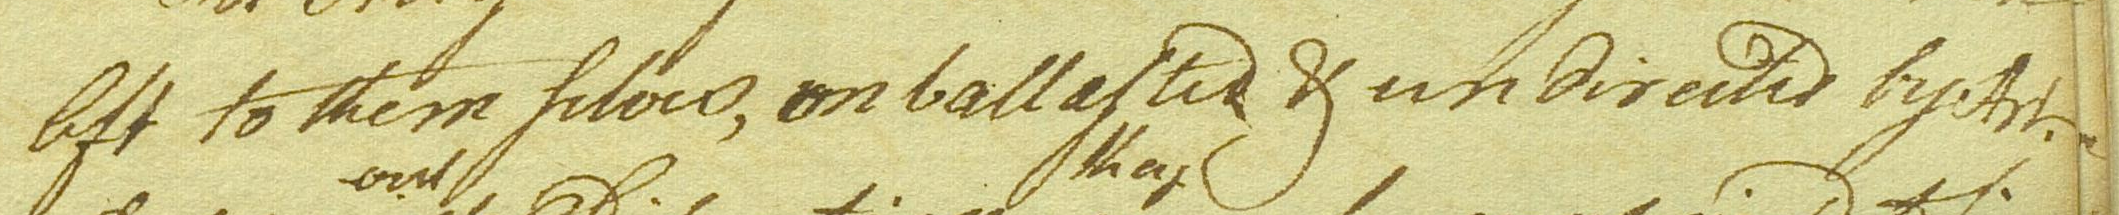left to themselves, un ballasted & undirected by Art,
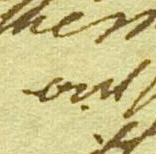out
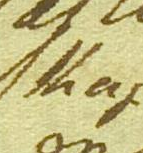they
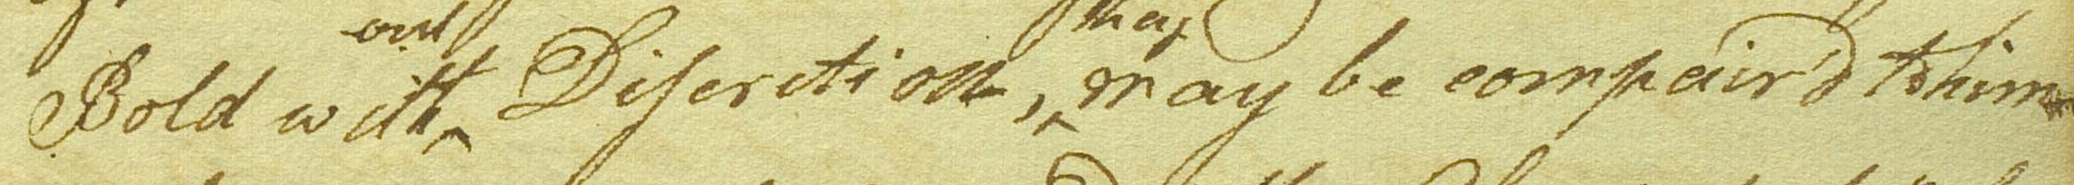Bold with ^ Discretion, ^ may be compair'd to him
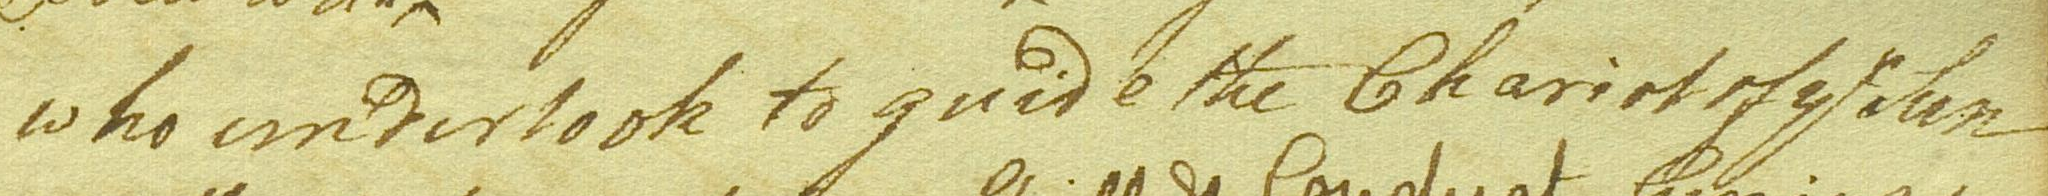who undertook to guide the Chariot of y^e Sun
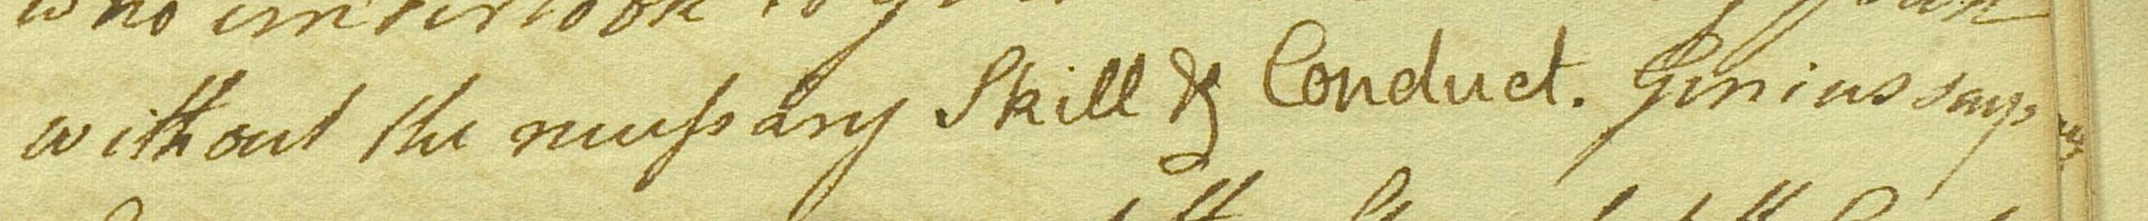without the necessary Skill & Conduct. Genius says
